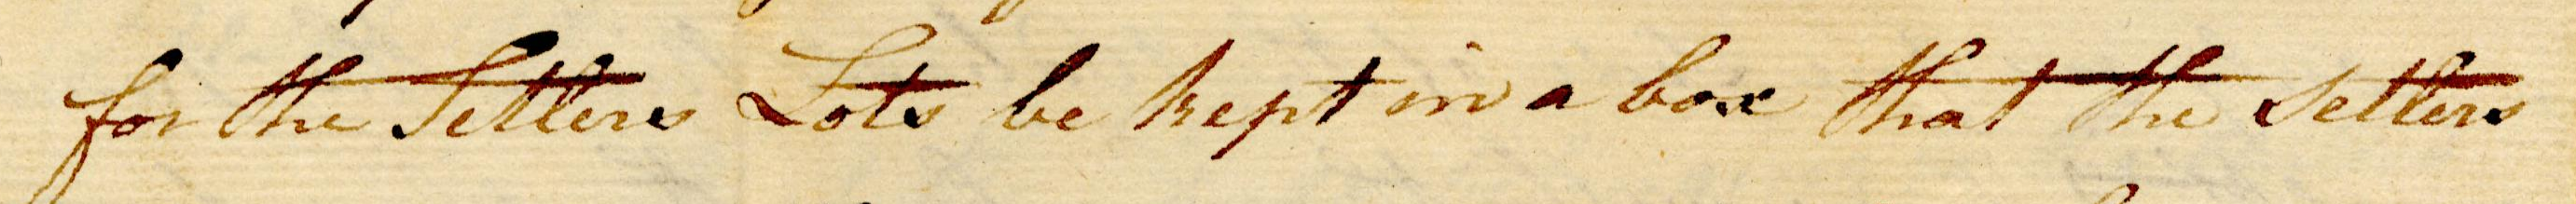for the Setters Lots be kept in a box that the Setlers
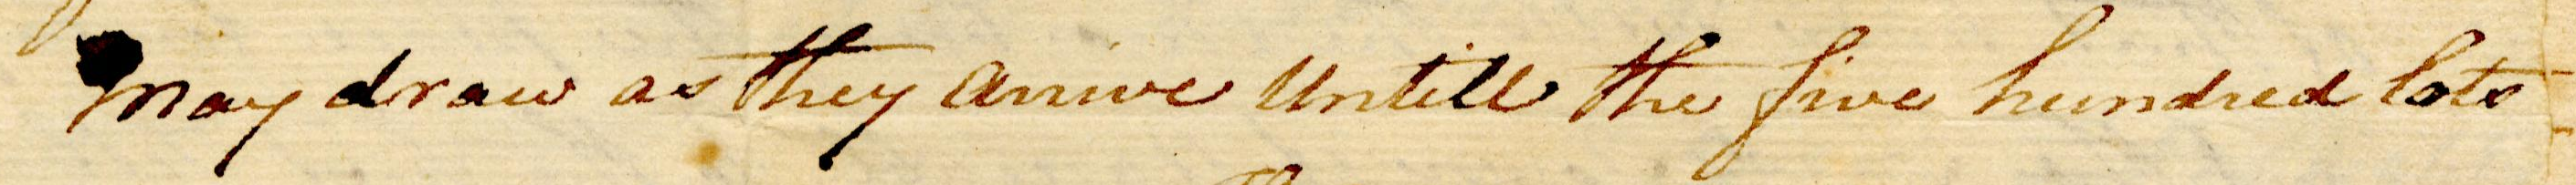May draw as they arrive Untill the five hundred lots
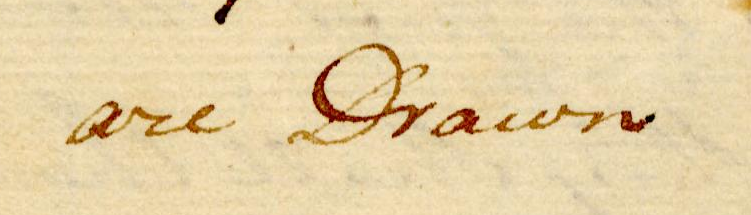are Drawn
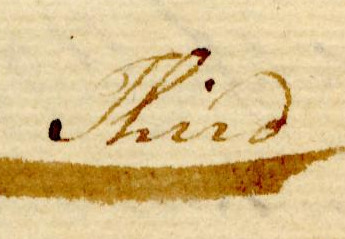Third
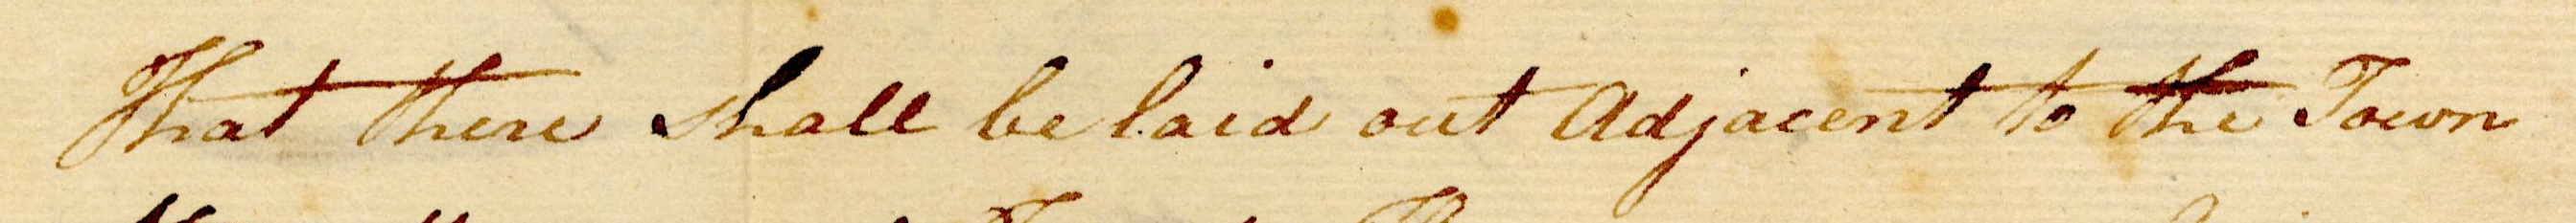That there shall be laid out Adjacent to the Town
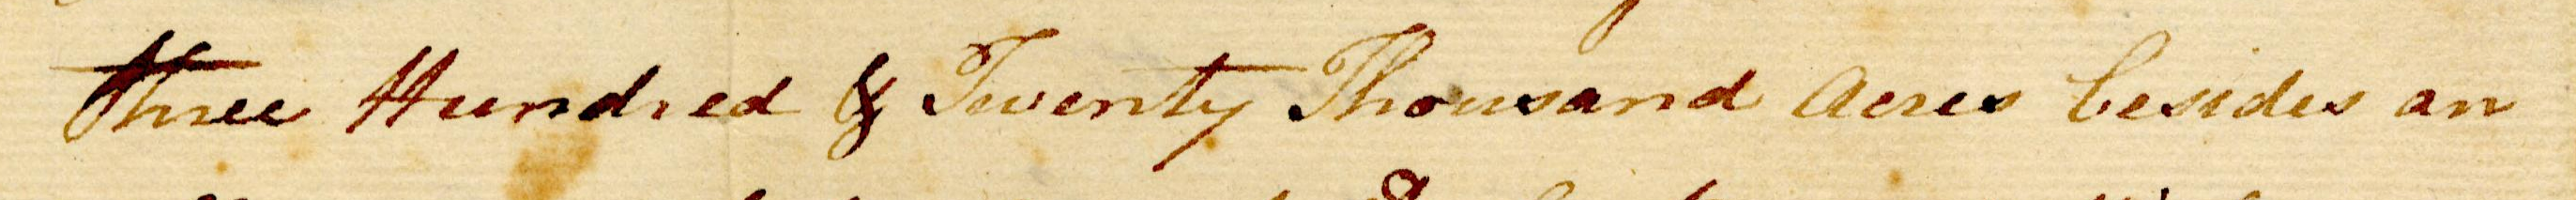three Hundred & Twenty Thousand Acres besides an
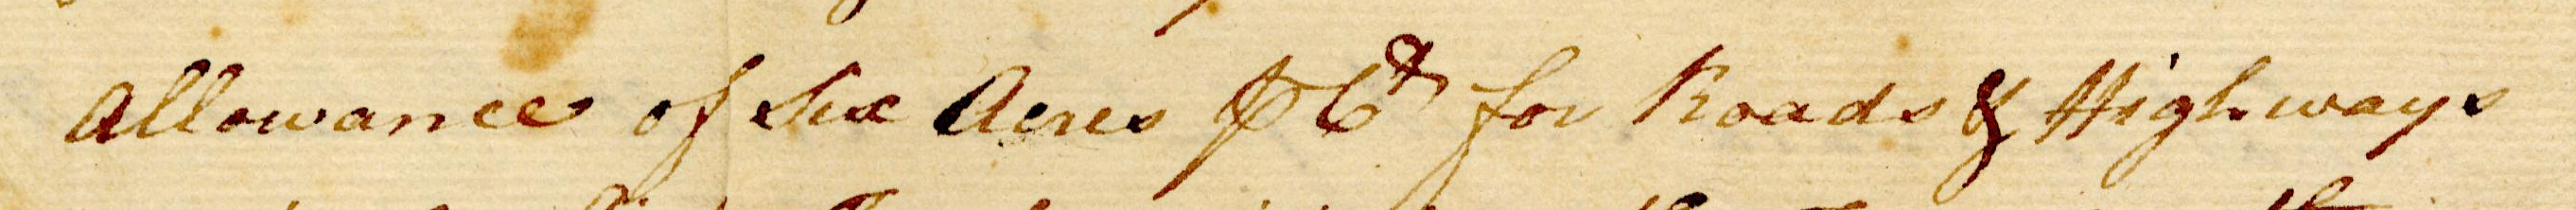Allowance of Six Acres per 6^a for Roads & Highways
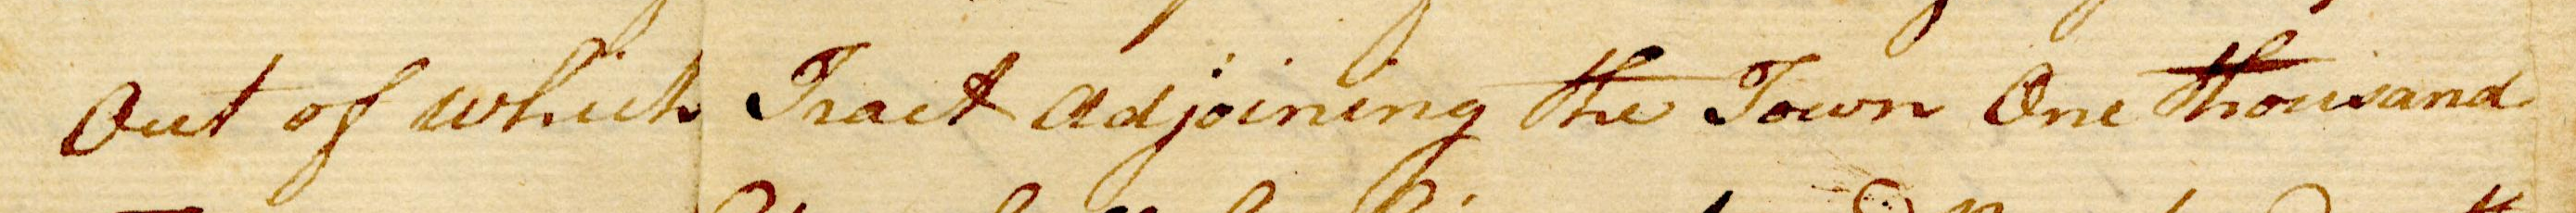Out of which Tract adjoining the Town One thousand
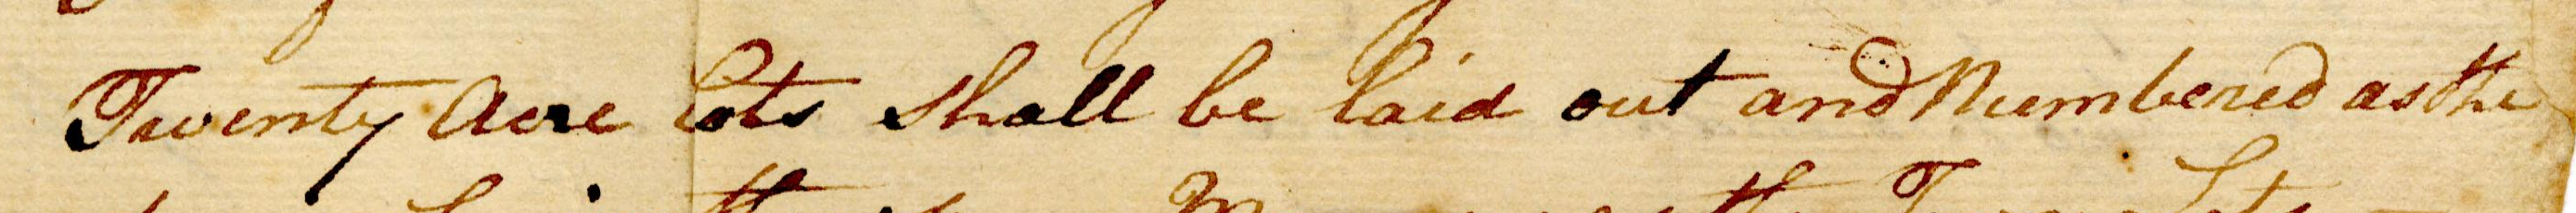Twenty Acre lots shall be laid out and numbered as the
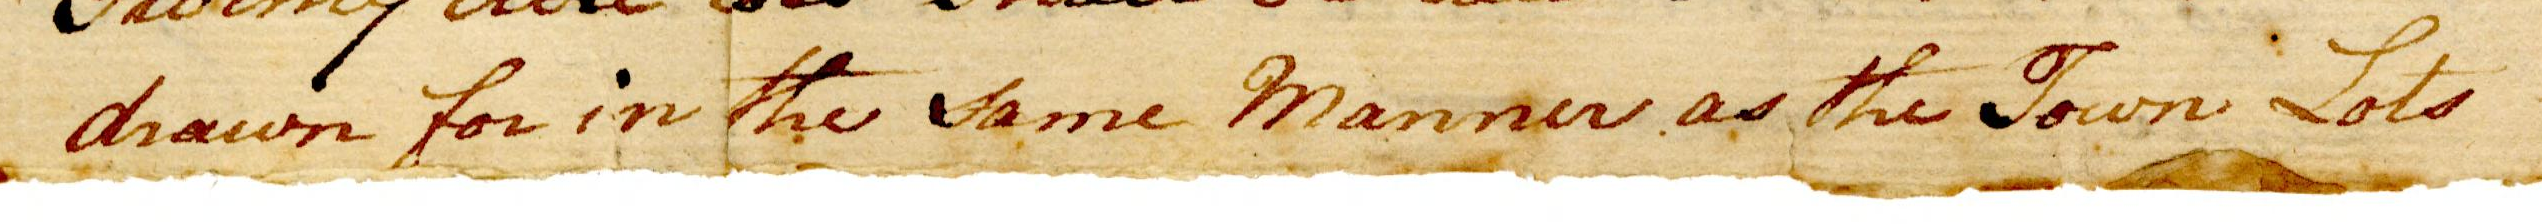drawn for in the same Manner as the Town Lots
